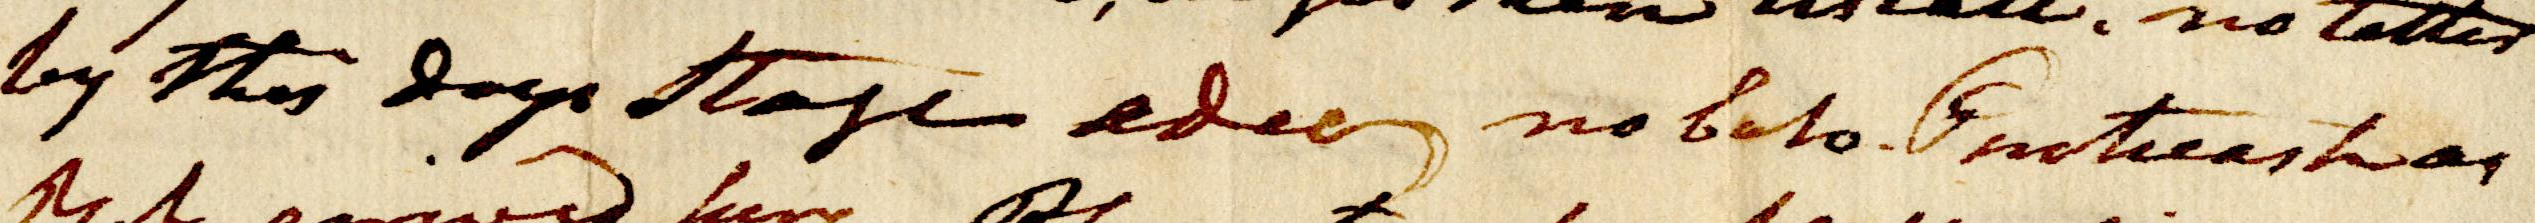by this days stage order no Colo Pretuas has
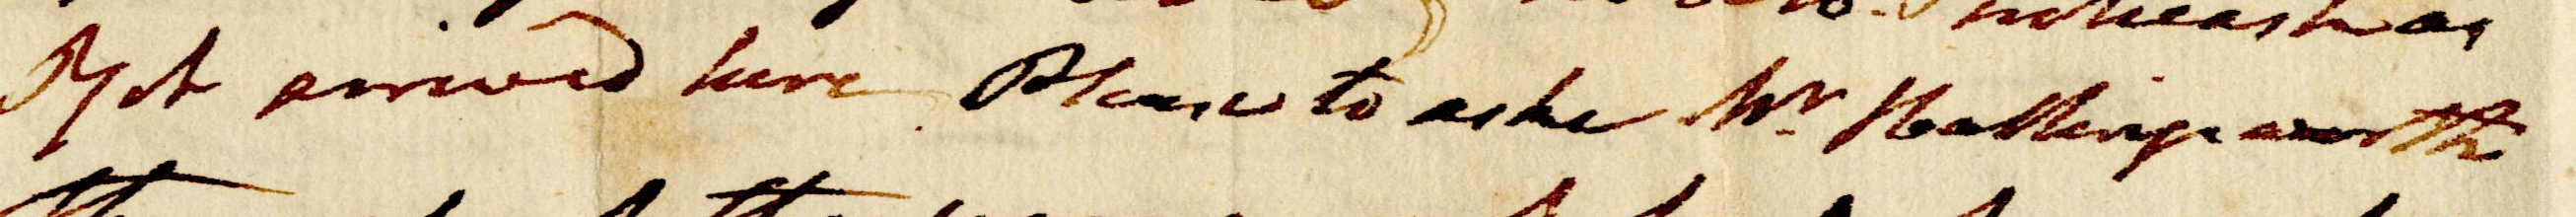Yet arrived here Please to aske M^r. Hollingsworth
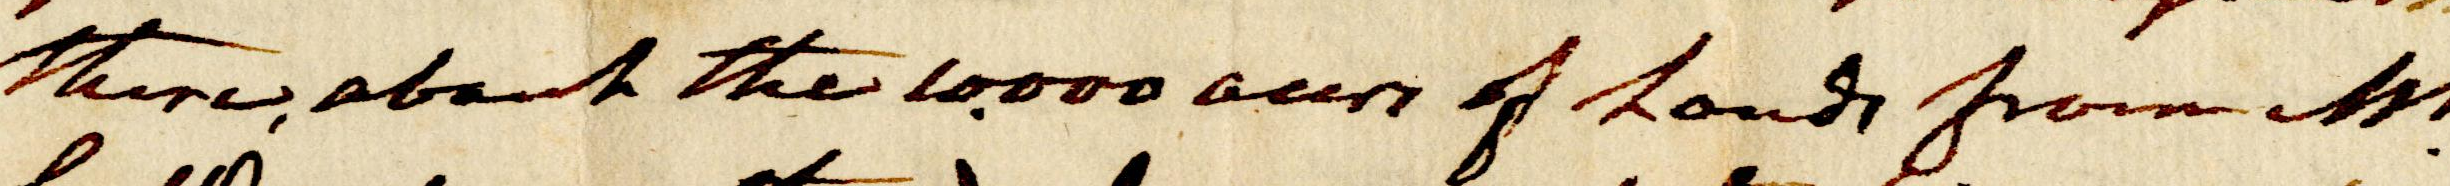there, about the 10,000 acres of Lands from M^r
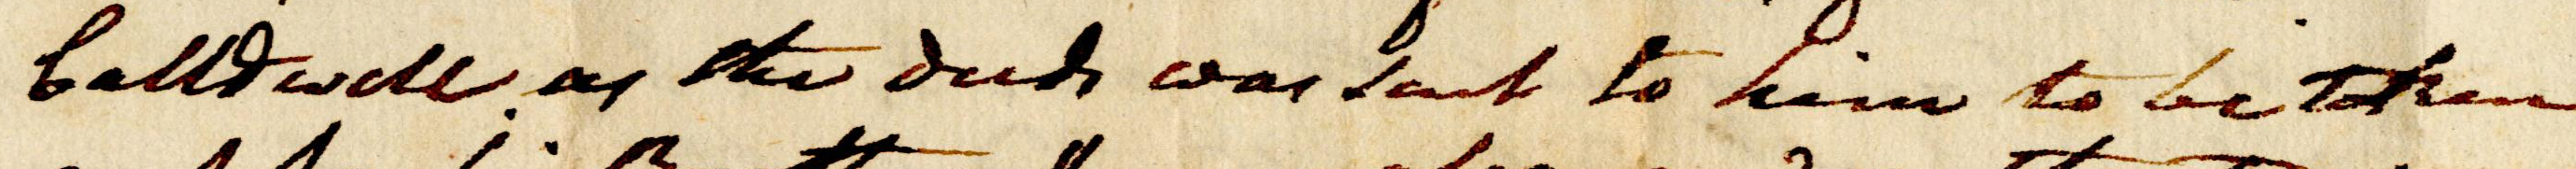Calldwell as the deeds was sent to him to be taken
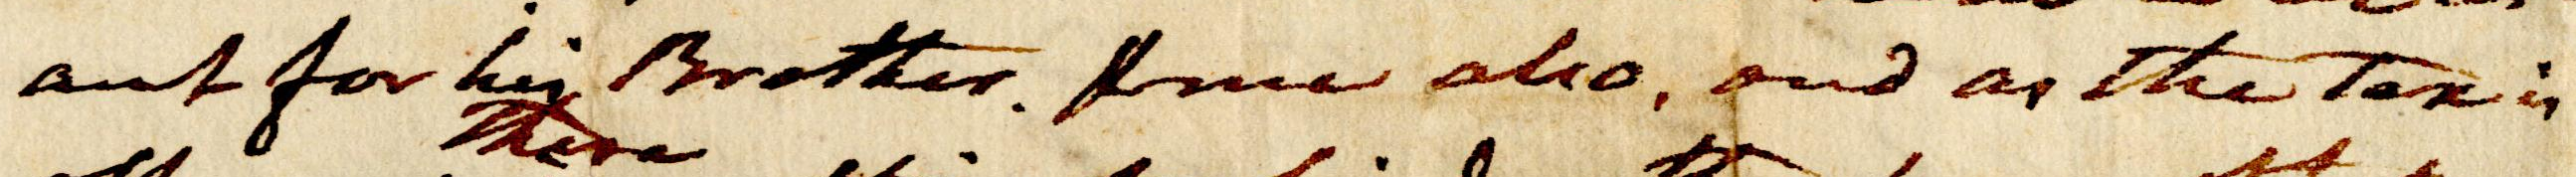out for his Brother. please also, and as the tax is
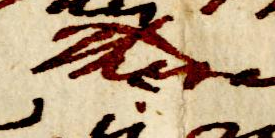there
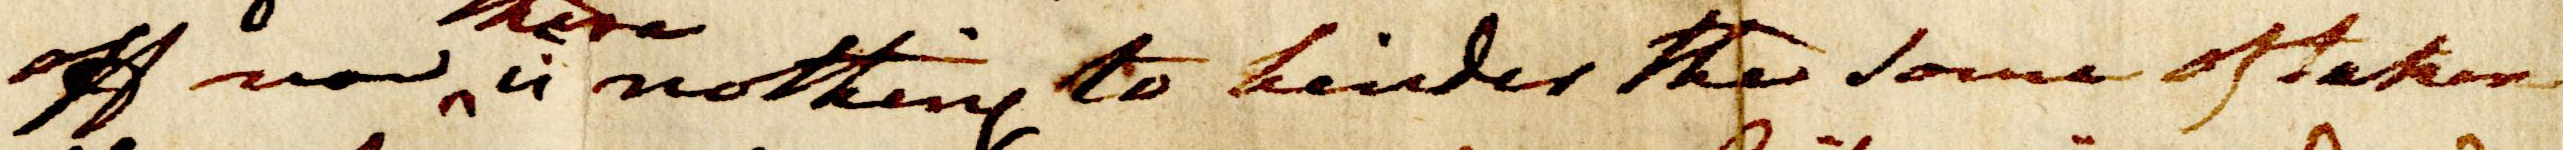off now ^ is nothing to hinder the same of taken
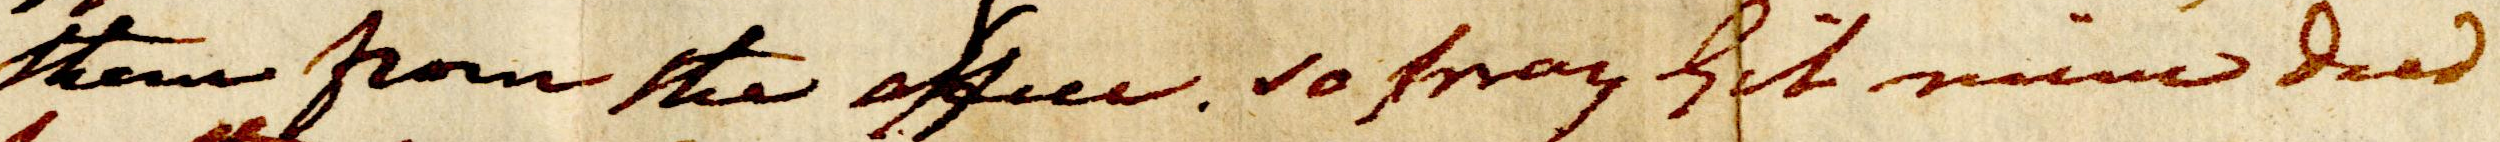them from the office, so pray Git mine deed
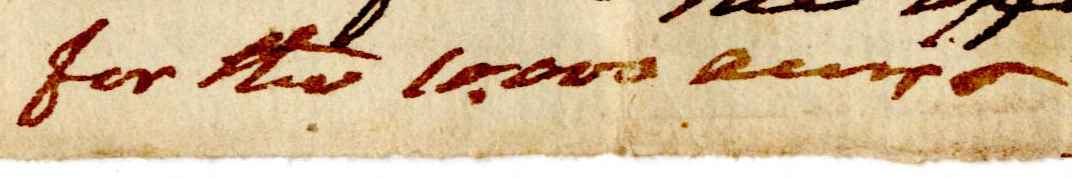for the 10,000 acres
